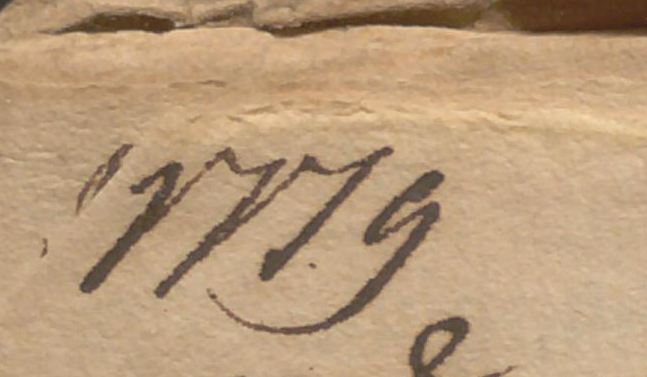1779
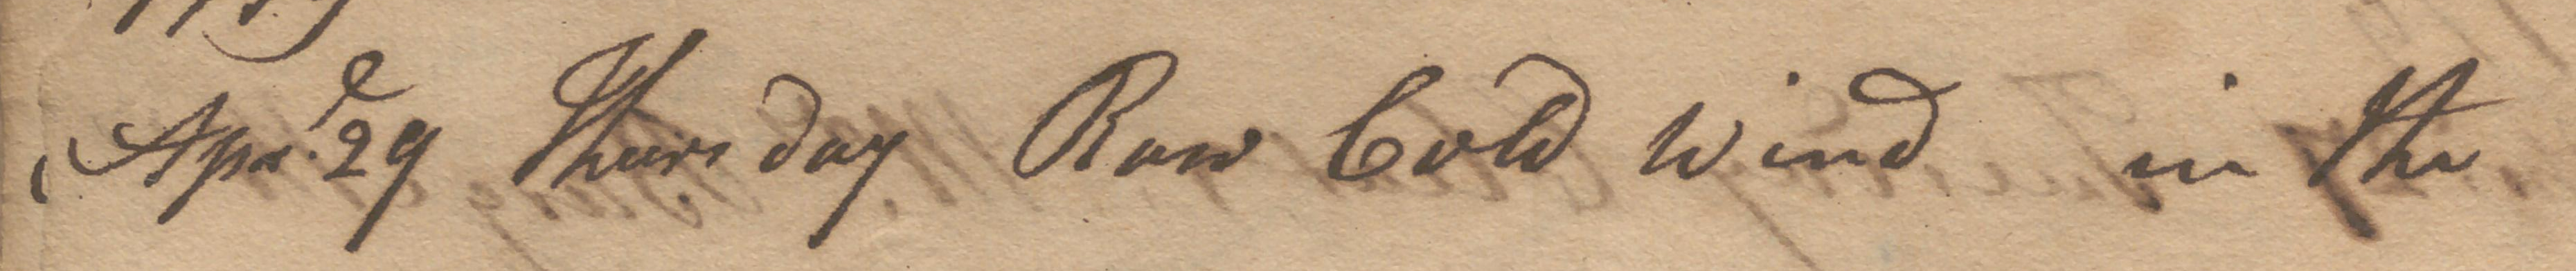Apr^l. 29 Thursday Raw Cold wind in the
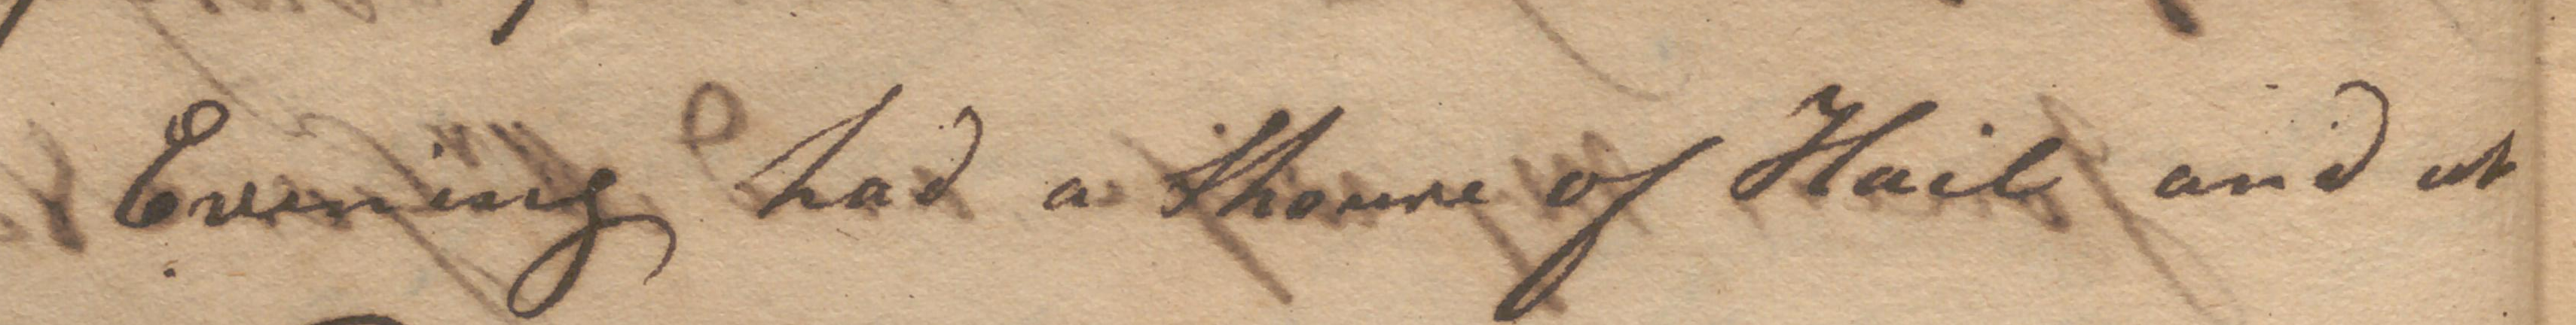Evening had a shoure of Hail and at
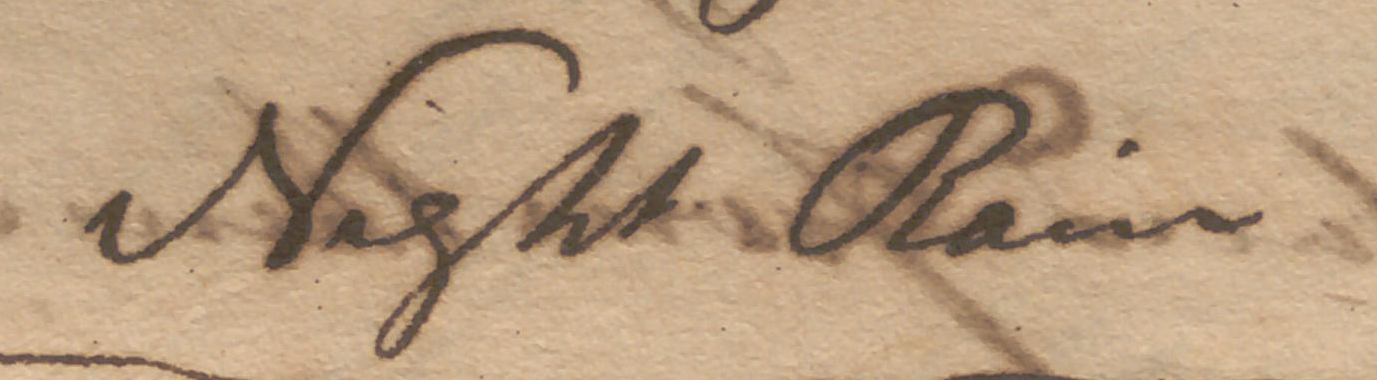Night Rain
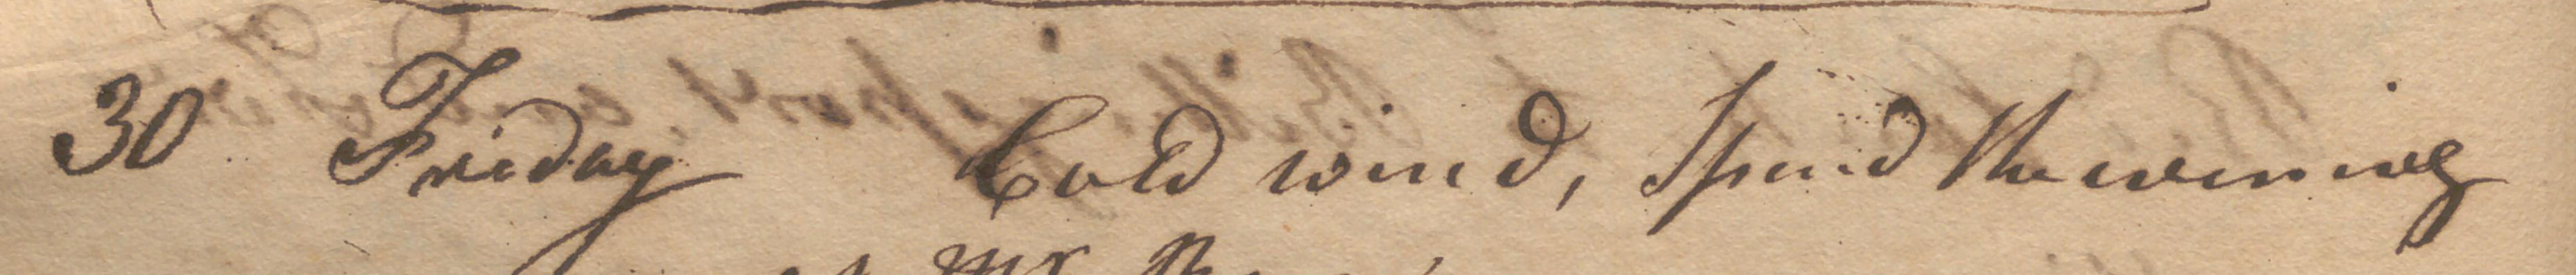30 Friday Cold wind, spend the evening
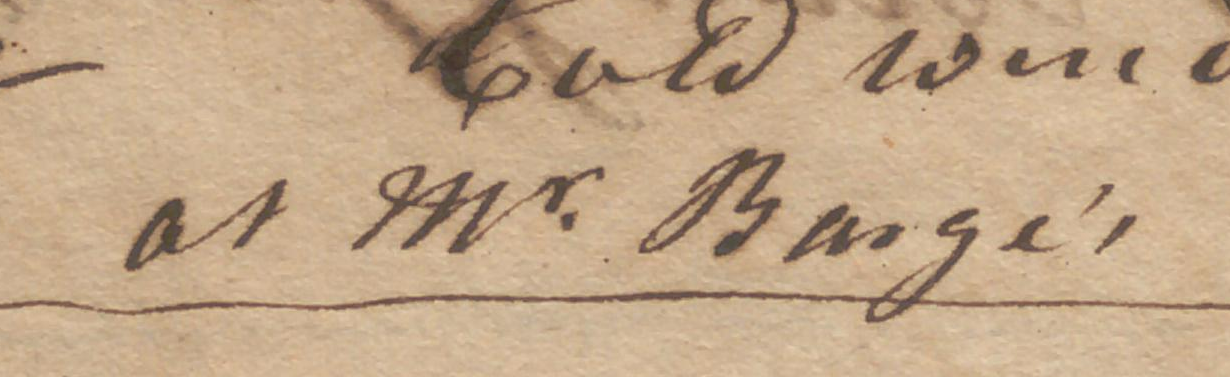at M^r. Barge's
